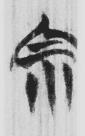宗
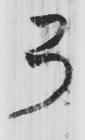乃
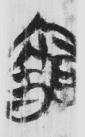{尒䎽}
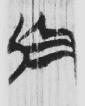於
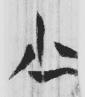少
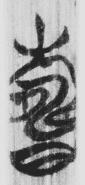壽
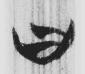曰
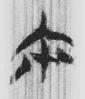尔
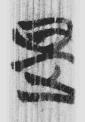是
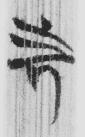先
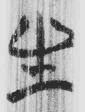生
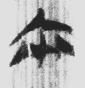尔
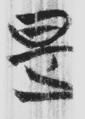是
